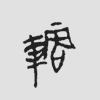{車丙}
